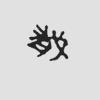歲
